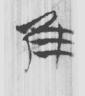隹
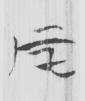厇
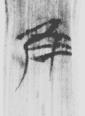隹
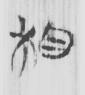相
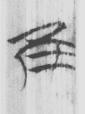隹
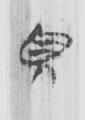{目人}
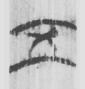五
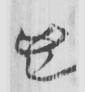兇
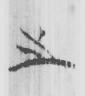之
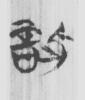訿
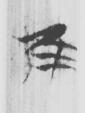隹
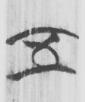五
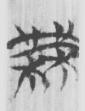無
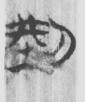型
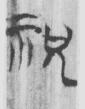祝
